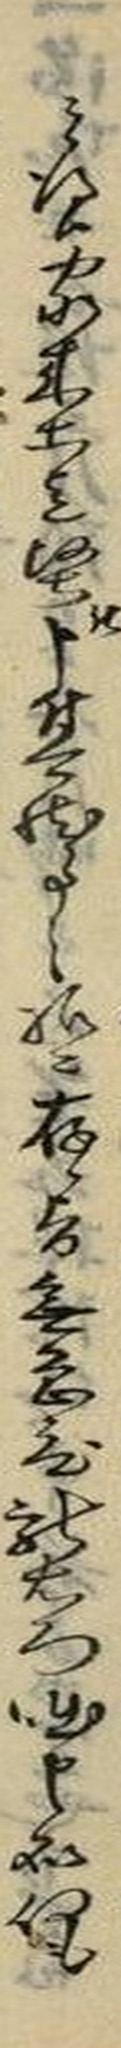に候得は家来等迄堅被申付可然事之様に存候旨無急度新右衛門咄申処何も
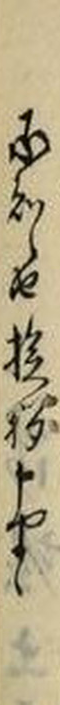承知之由挨拶申聞候
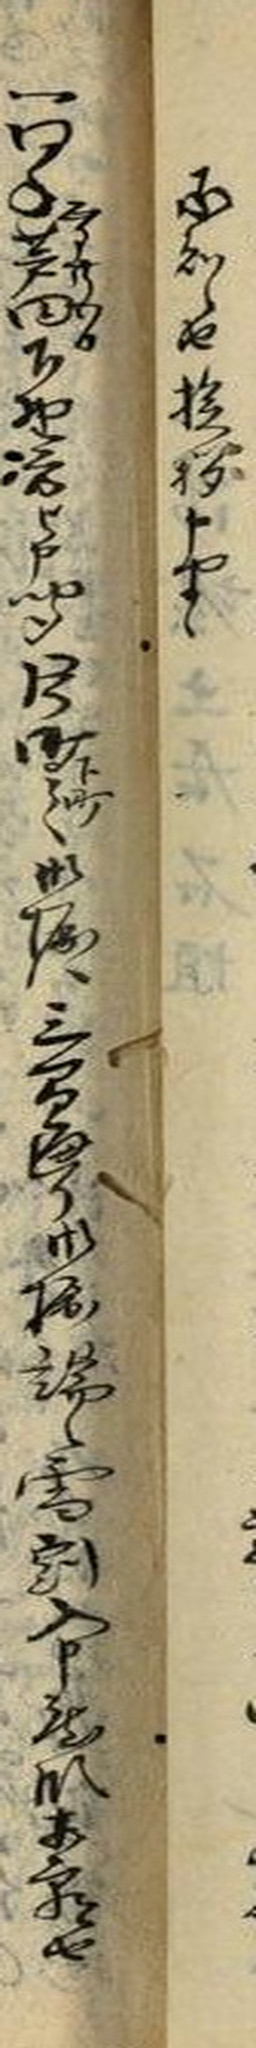一同年正月廿五日芦田下野方被申聞片町◦下町之御堀へ三間通り御堀端之雪割入申度段相願候由
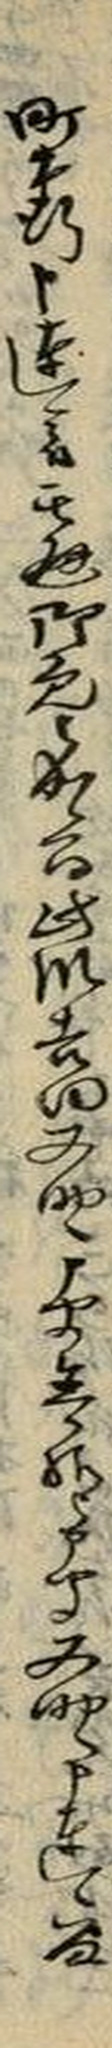町奉行申達候に付其通御免被成候間此段吉田又助へ申聞置候様被申聞又助へ申達候留
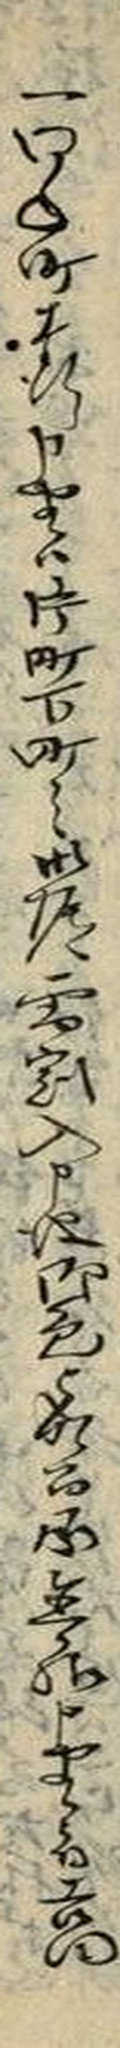一同年町奉行申聞候は片町下町之御堀へ雪割入申儀御免被成候間承置候様申聞候に付吉田
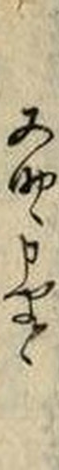又助へ申聞候
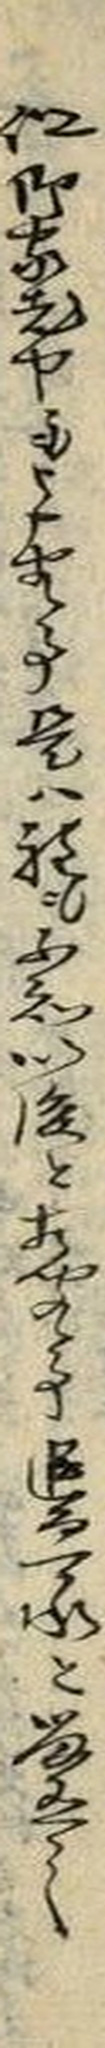但御家老中へも被申聞候事是は程も不知以後と相聞候事追て可承と留有之
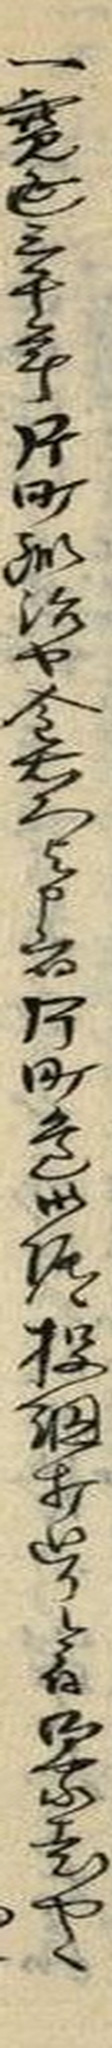一寛延三午年片町鍛冶や金右衛門と申者片町辺御堀へ投網打廻り候に付御家老中へ
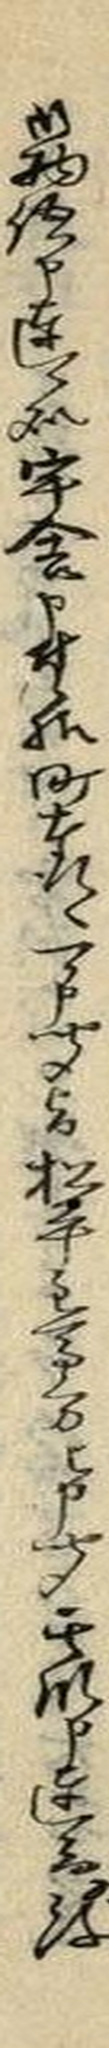御物語申達候処牢舎申付候様町奉行へ可申聞旨松平主馬方被申聞其段申達候て為致
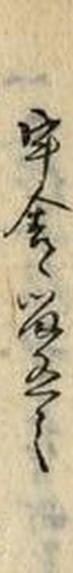牢舎候留有之
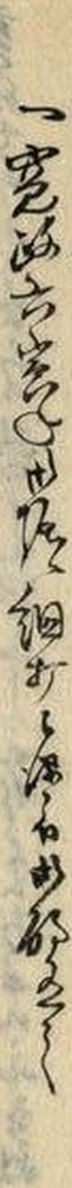一寛政六寅年御堀へ網打候儀に付御触有之
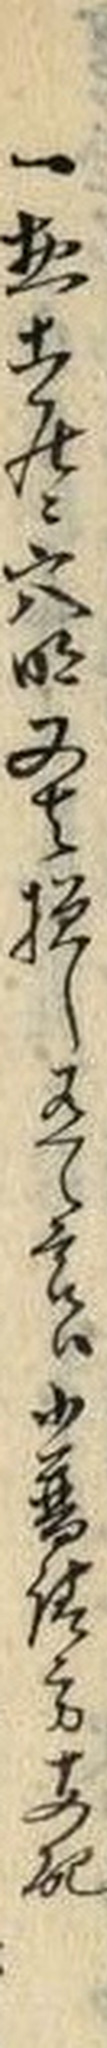一惣土居に穴明又は損し有之節は小普請方支配
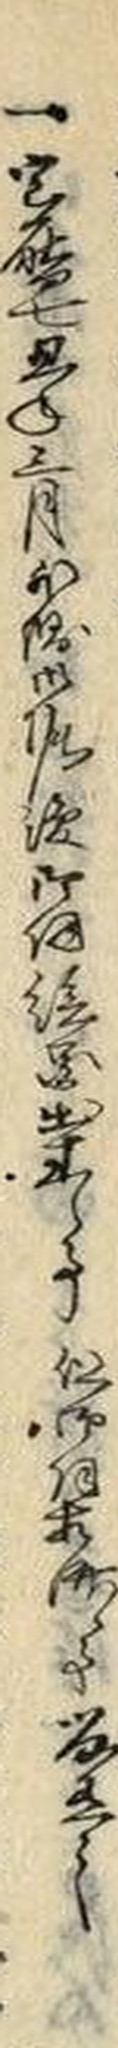一宝暦七丑年三月外側御堀浚御伺絵図出来之事但御伺相済候事留有之
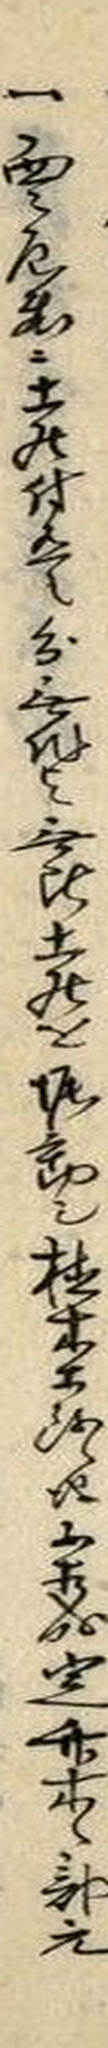一面々屋敷に土居付有之分無作と無断土居を掘動シ植木等致候儀不相成定竹木之部元
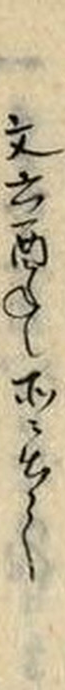文六酉年之所に出之
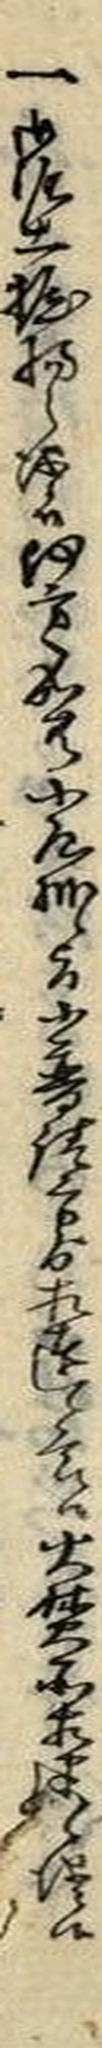一御堀土掘場之儀に付何方へ成共小屋掛候旨小普請方ゟ相達候節は火焚所相建候儀に候
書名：御城下諸事之部
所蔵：福井県文書館 Fukui Prefectural Archives
